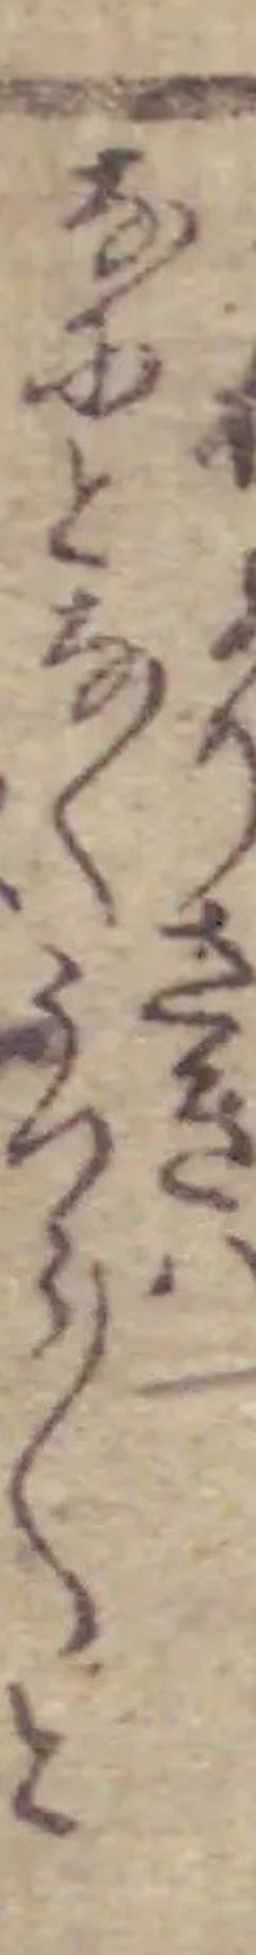なにとなくうつら〳〵と
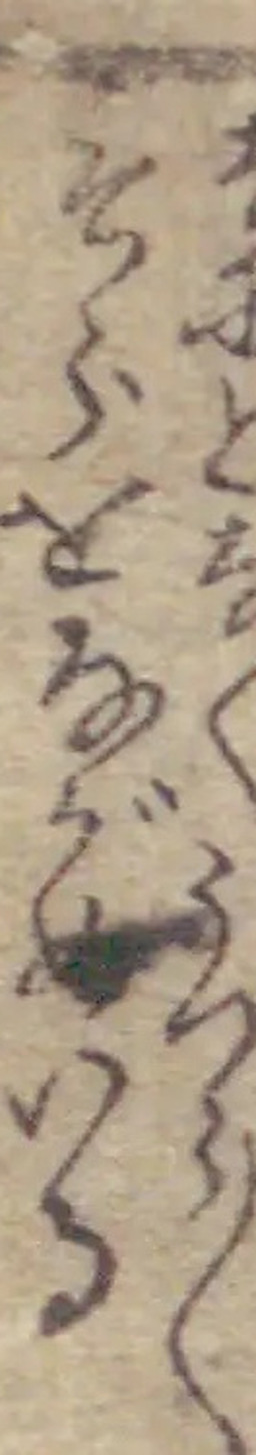そらをながめいる
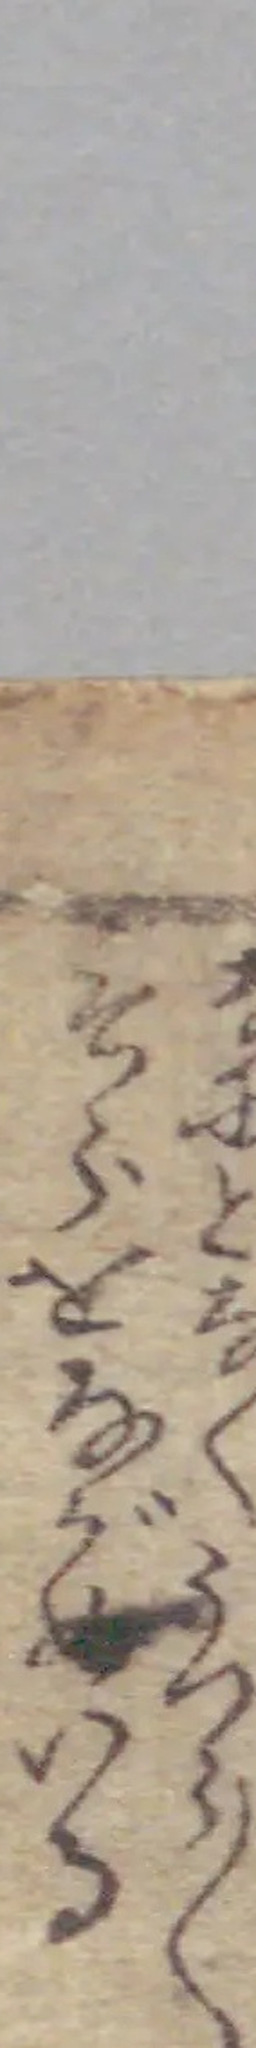そらをながめいる

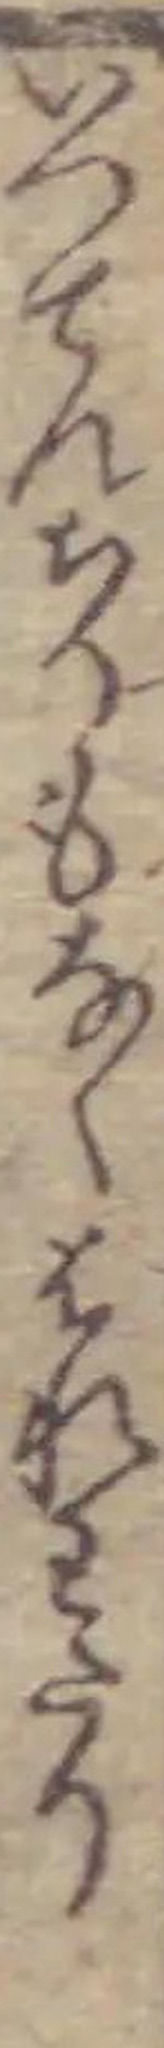いつてんちりもなくはれわたり
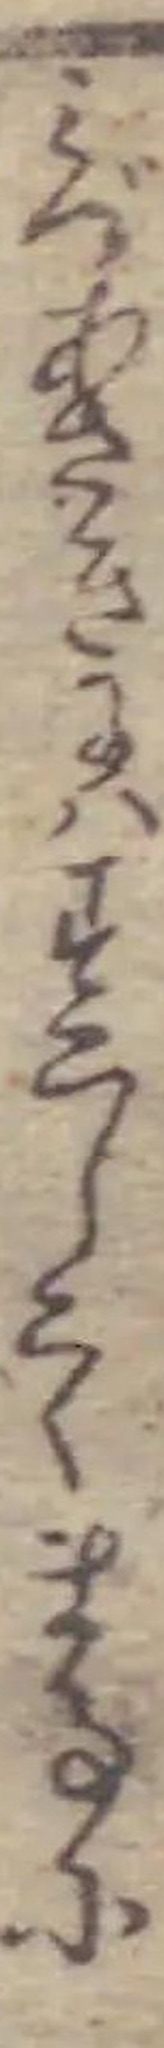みづあさきにはすこしこくまるに
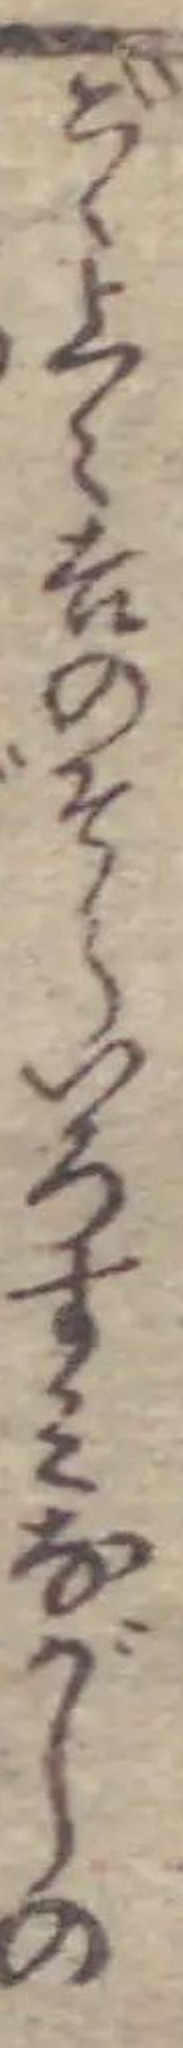ごく上〻吉のそらいろすみながしの
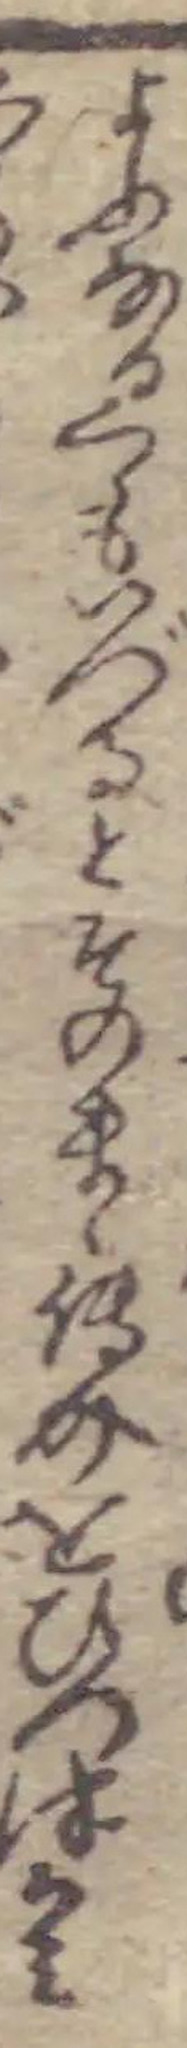よふなるくもいづるとそのまゝ伝介をひつつかみ
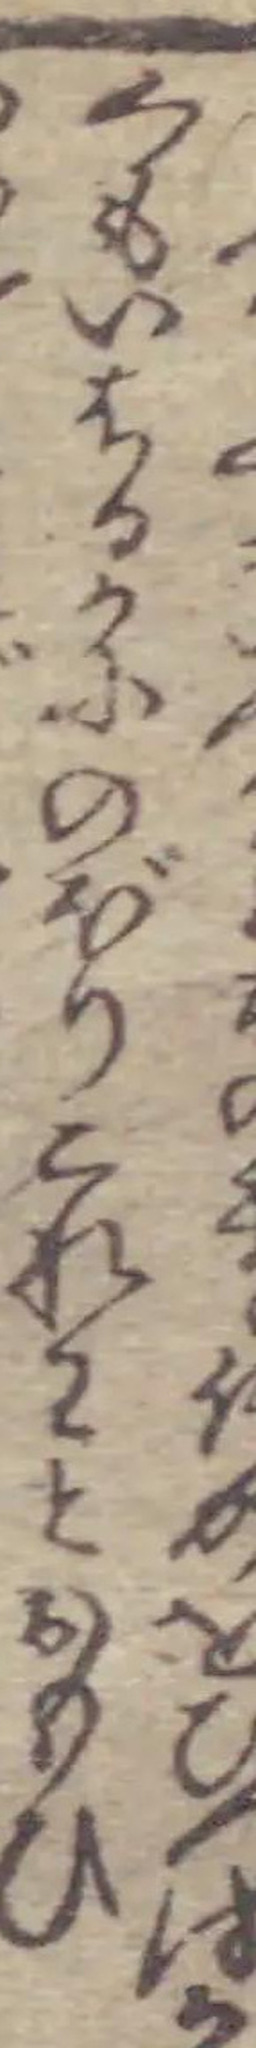くもいはるかにのぼりこれわとおもひ
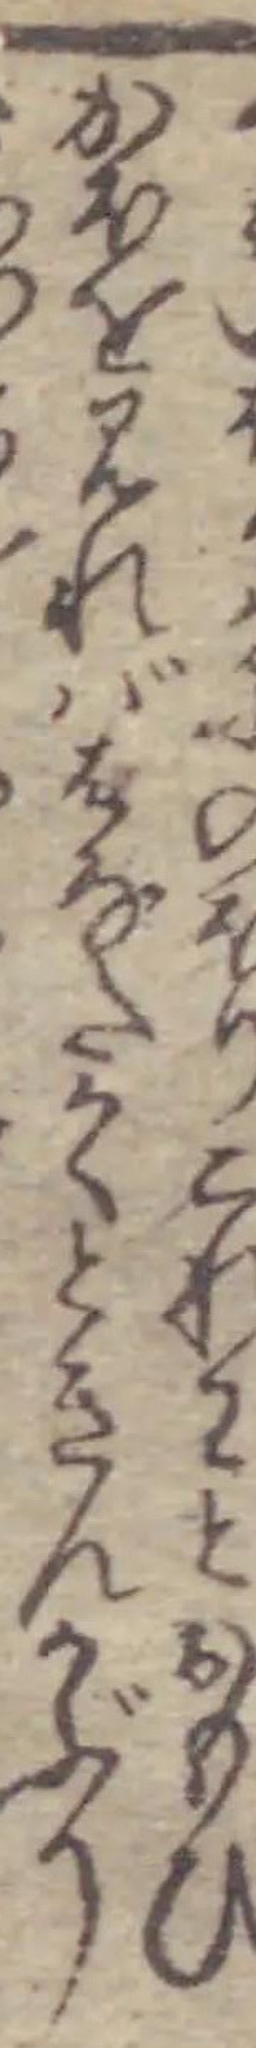かほを見れははなたかくときんかぶり
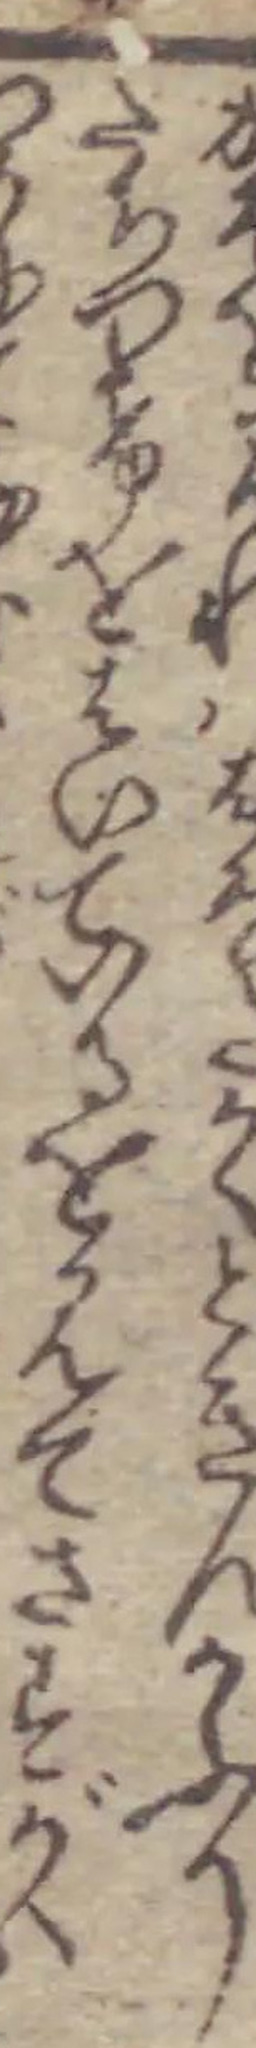たちつけをはいているを見てさすがは
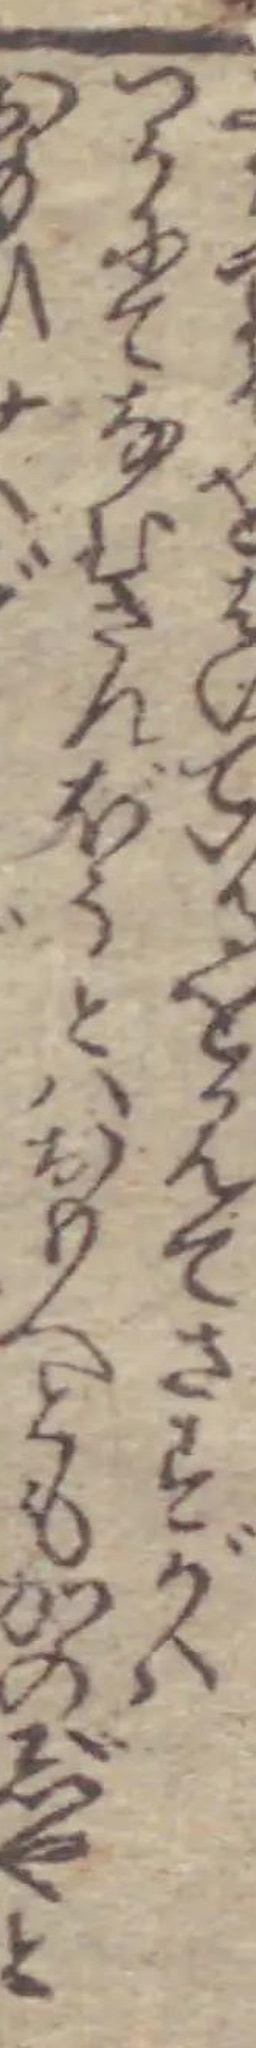つかにてなむさんぼうとはおもへともかのじやと
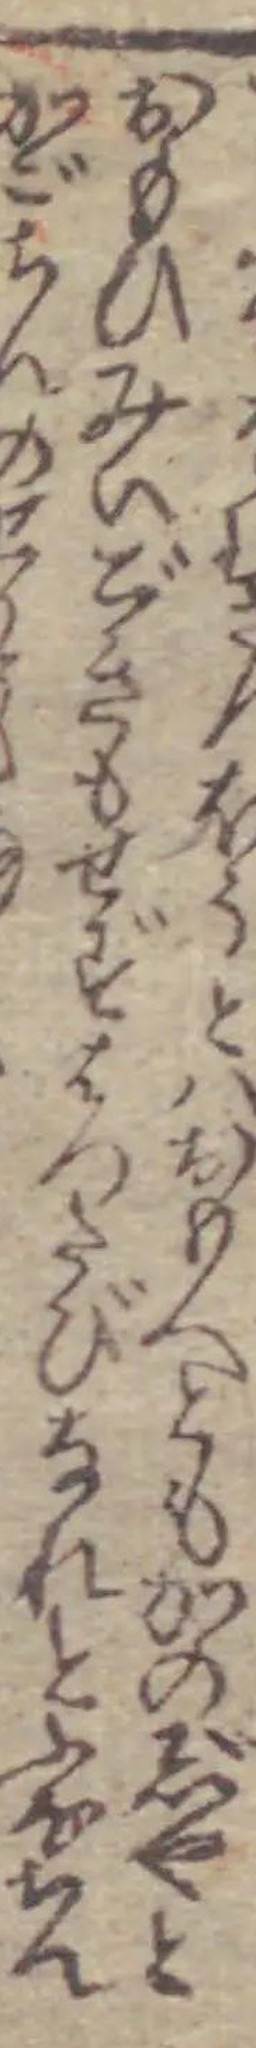おもひみいごきもせずはつたびなれとふなちん
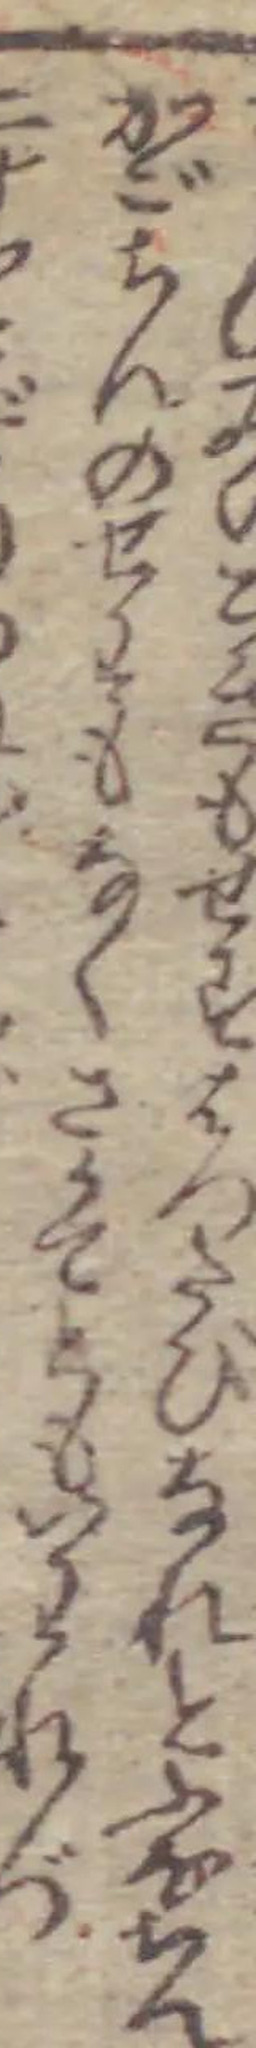かごちんのせわもなくさかてもいわれづ
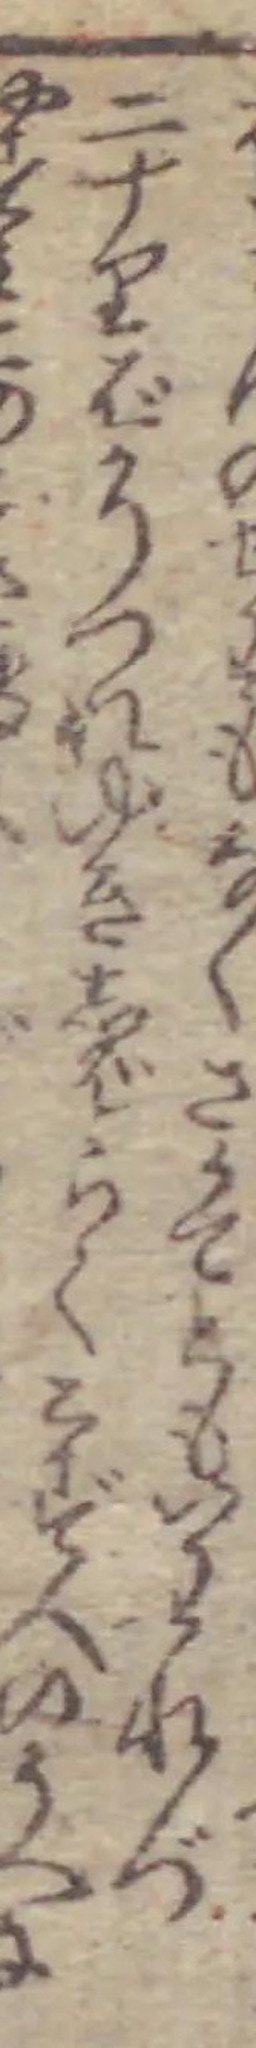二十里ばかりつれゆきしばらくこずへのうへに
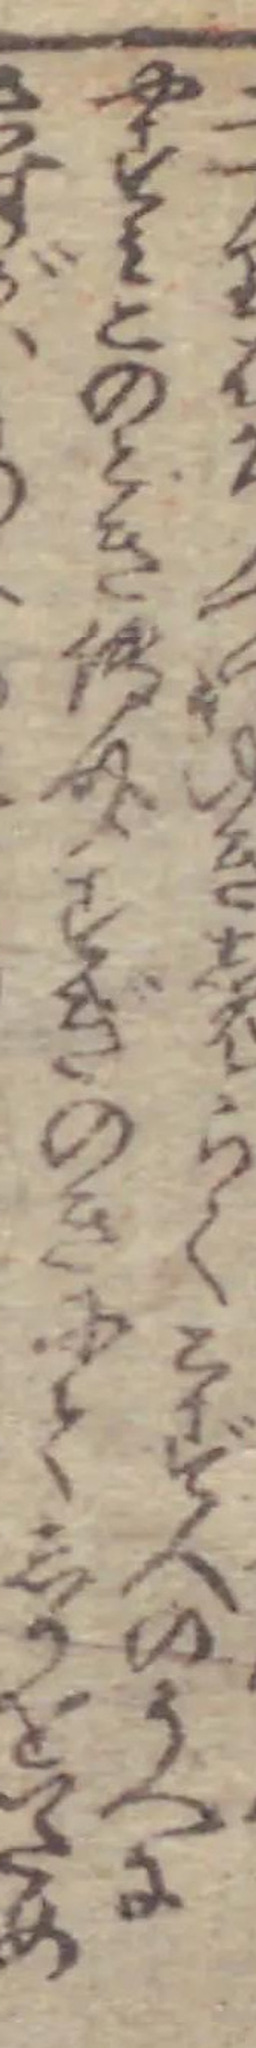やすみこのとき伝介すぎのきにてしりをいため
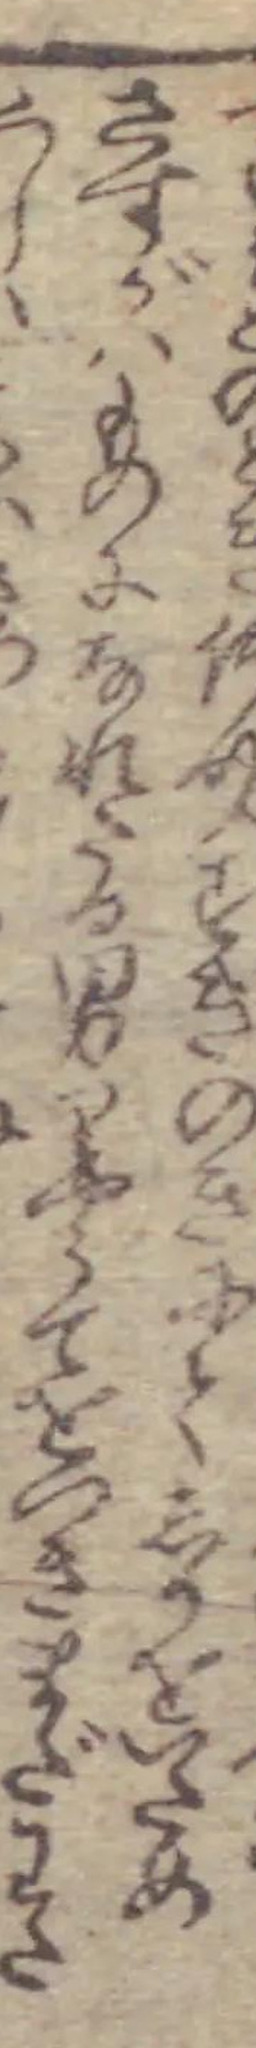さすがはものになれたる男りやうてをつきまだわた
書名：珍説女天狗 2巻
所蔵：国立国会図書館 National Diet Library, JAPAN
